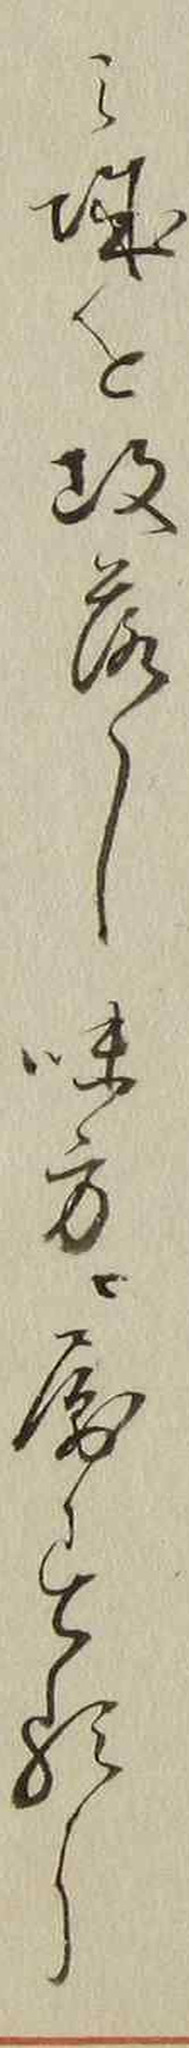之城を攻落し味方ニ属するに
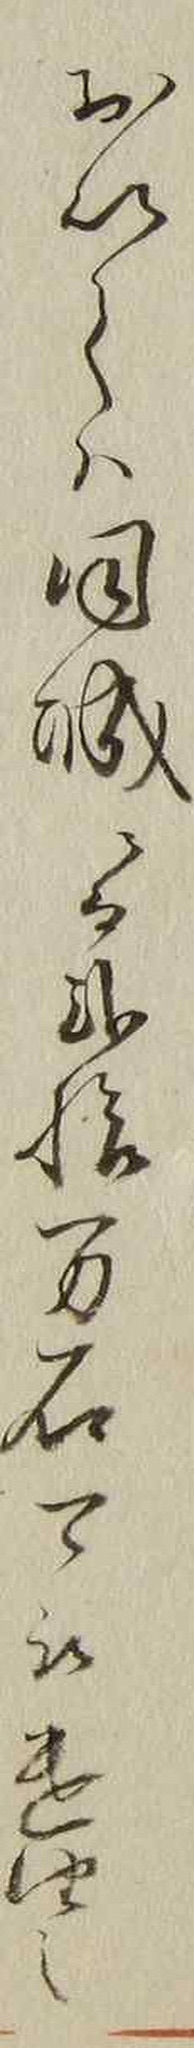おいてハ同城ニ而弐拾万石可被遣由之
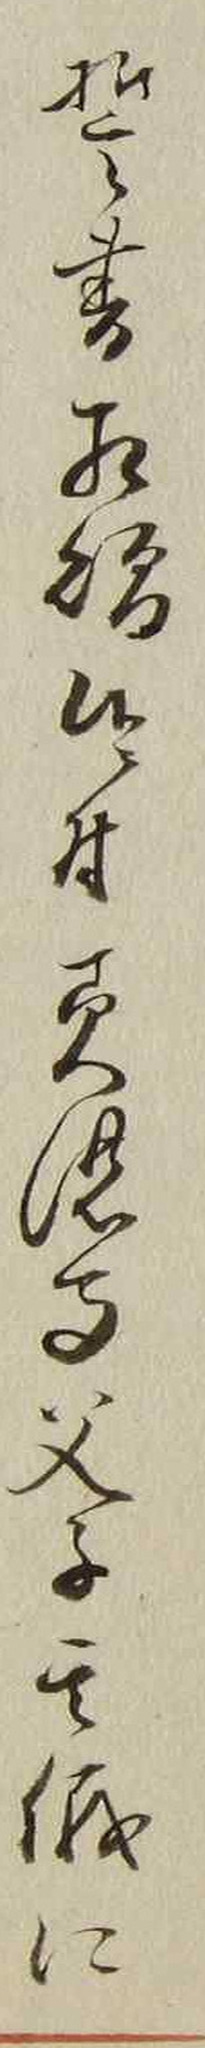誓書相贈候ニ付美濃寺父子其儀に
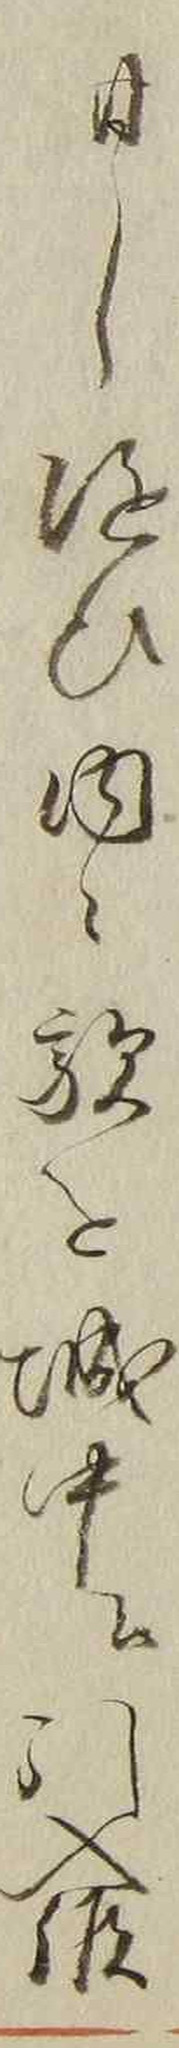甘く随ひ内々敵を城中江引入候
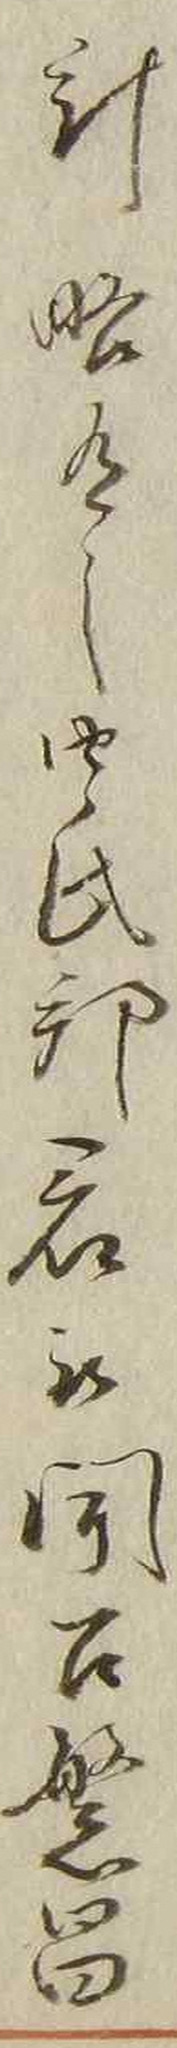計略有之由氏邦君被聞召繁昌

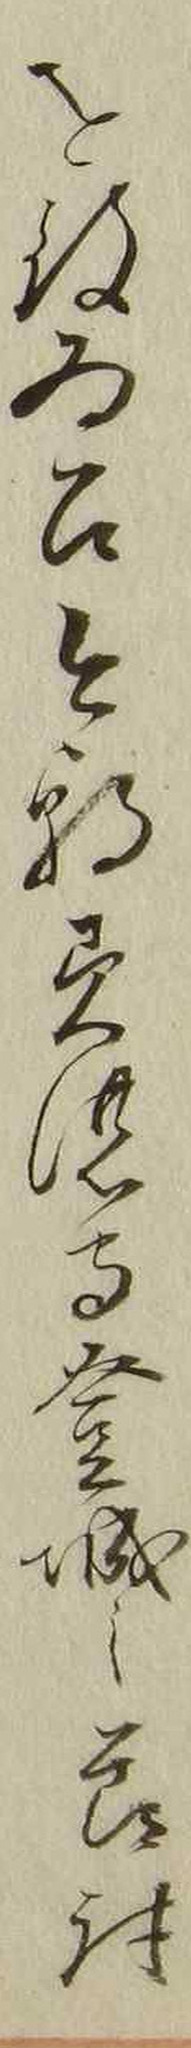を被為召今朝美濃守登城之節討
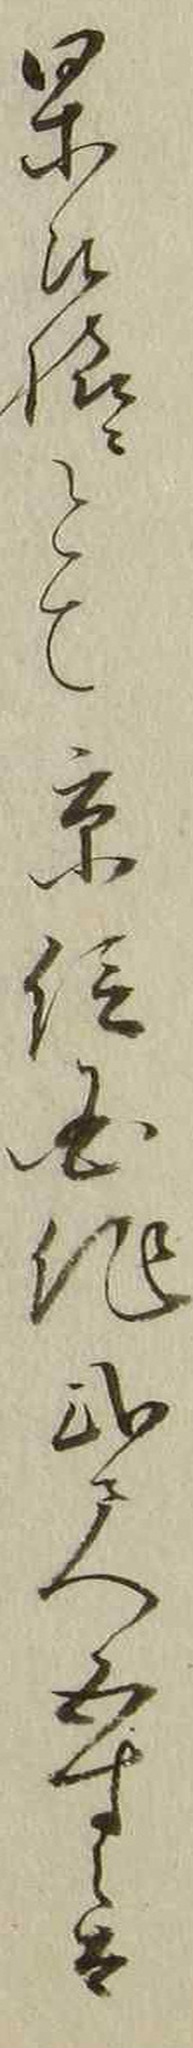果候様ニとて京信国作弐尺五寸之太
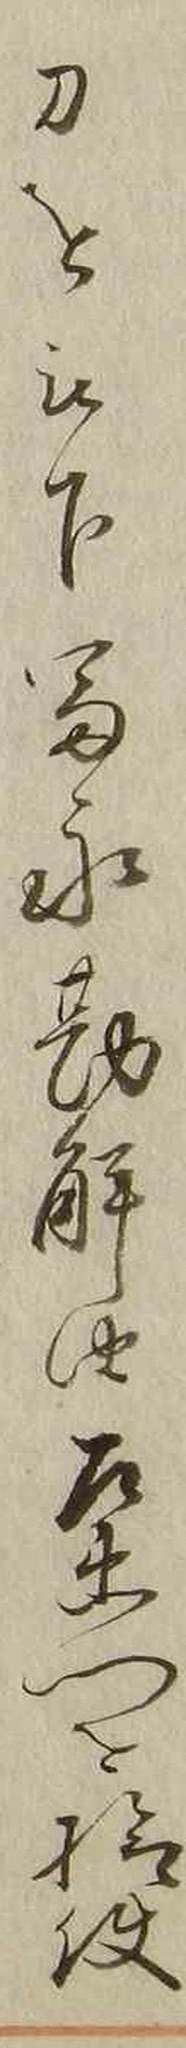刀を被下富永勘解由左衛門を検使
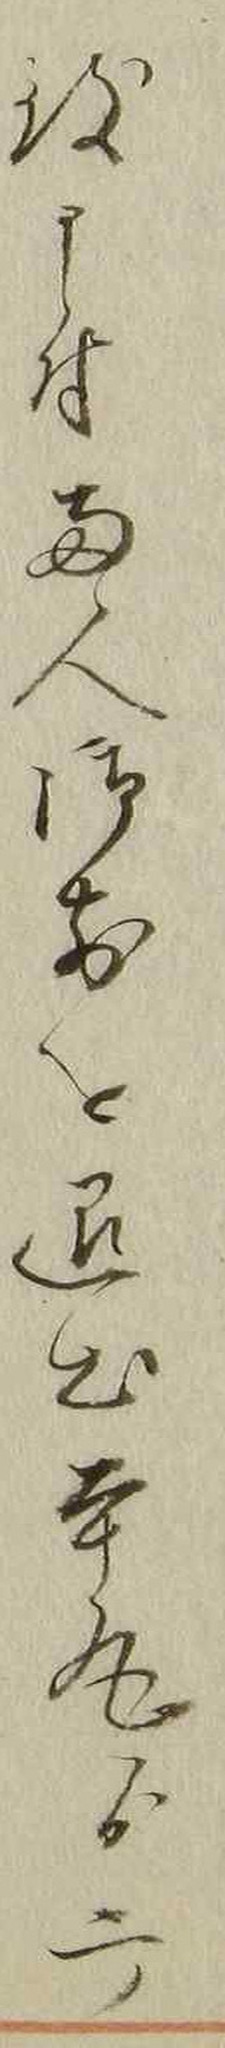致申付両人御前を退出本丸ゟ二ノ
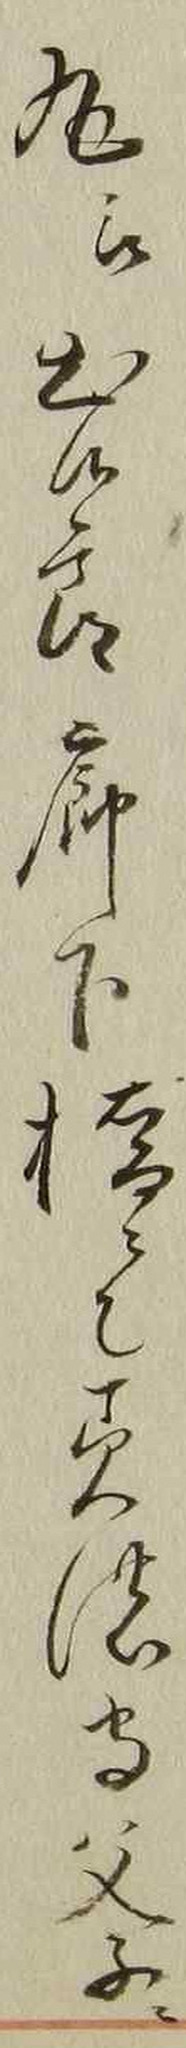丸江出候節廊下橋ニて美濃守父子ニ
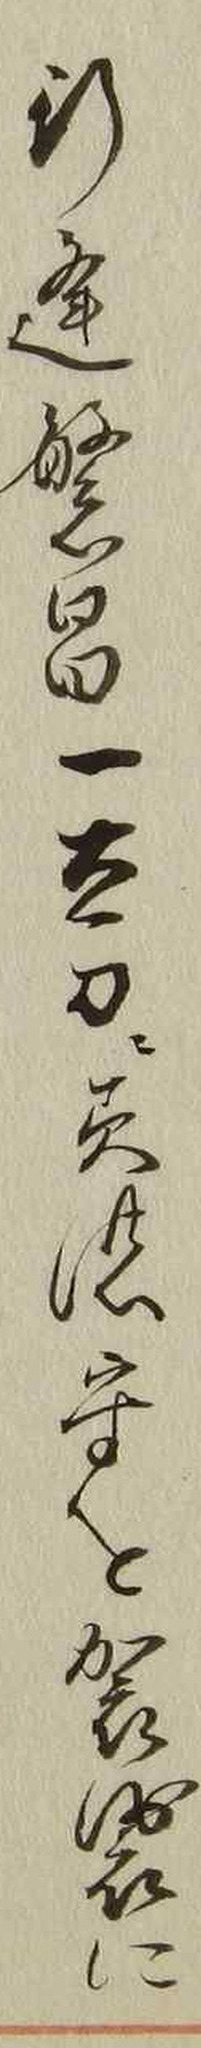行逢繁昌一太刀ニ美濃守を袈裟に
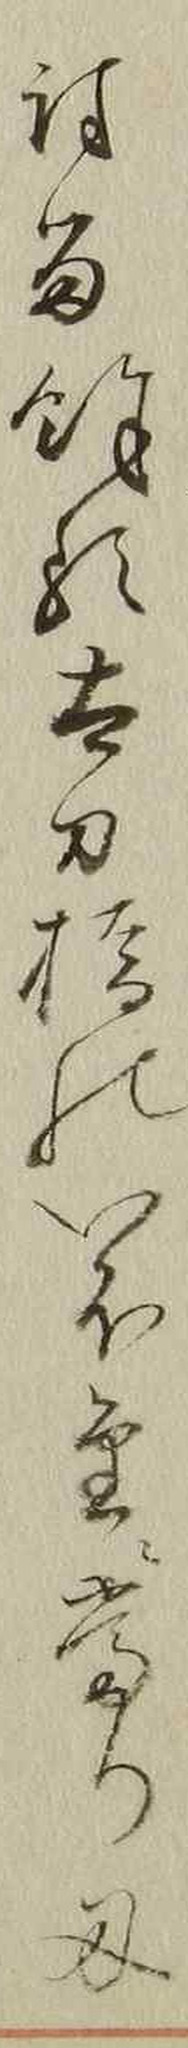討留余る太刀橋のいほ金ニ当り刃
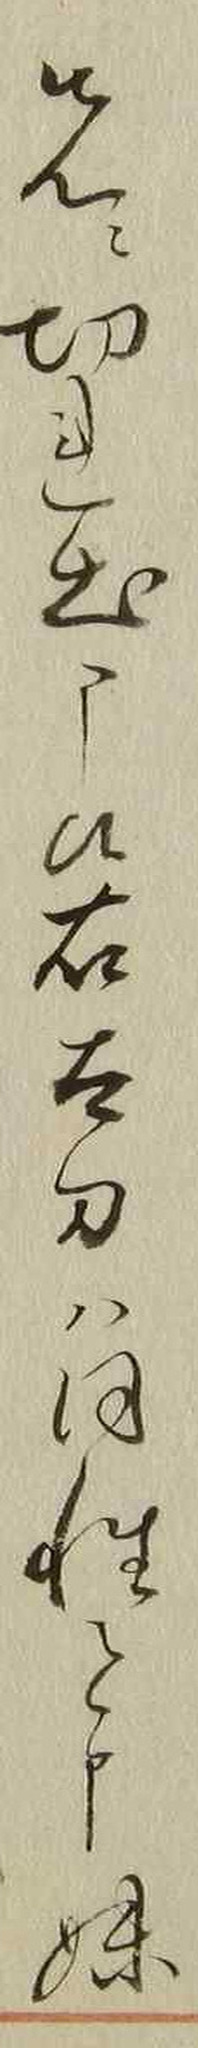先ニ切れ出申候右太刀ハ同性と申妹
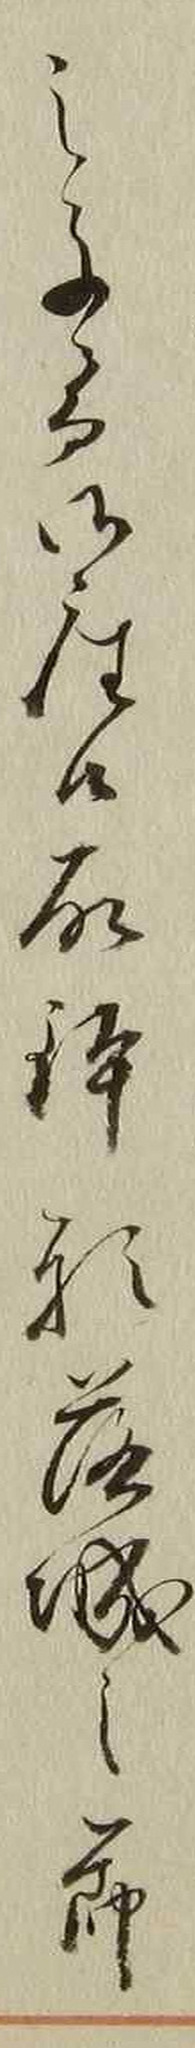之子ニ而御座候故鉢形落城之節
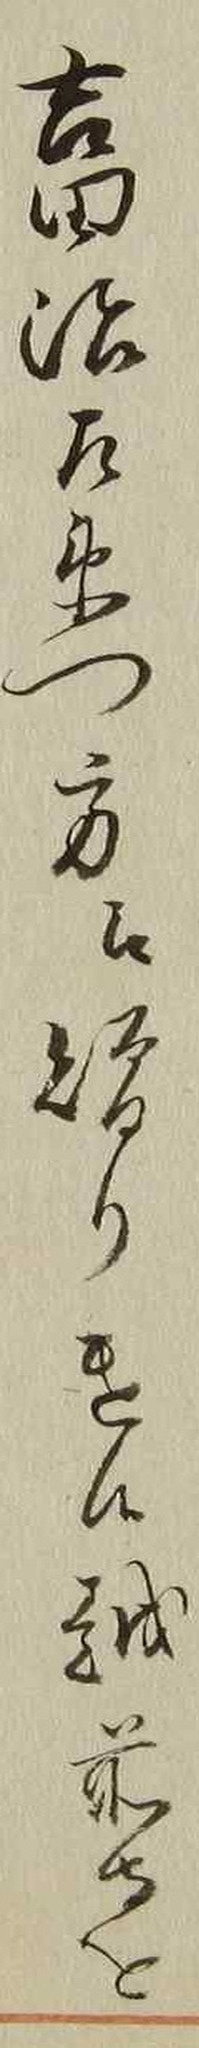吉田治左衛門方江贈り遣候越前守を
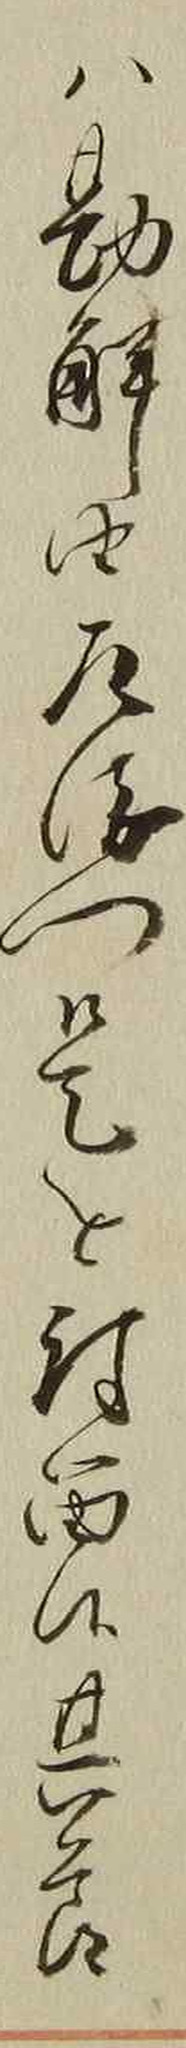ハ勘解由左衛門是を討留候其節
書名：諸士系譜　巻之122　よ之部5
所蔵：会津若松市立会津図書館
